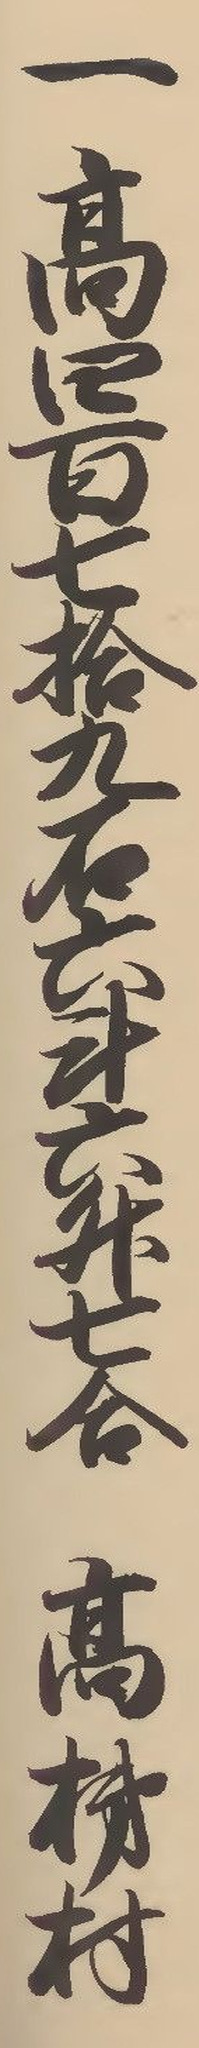一高四百七拾九石六斗六升七合高柿村
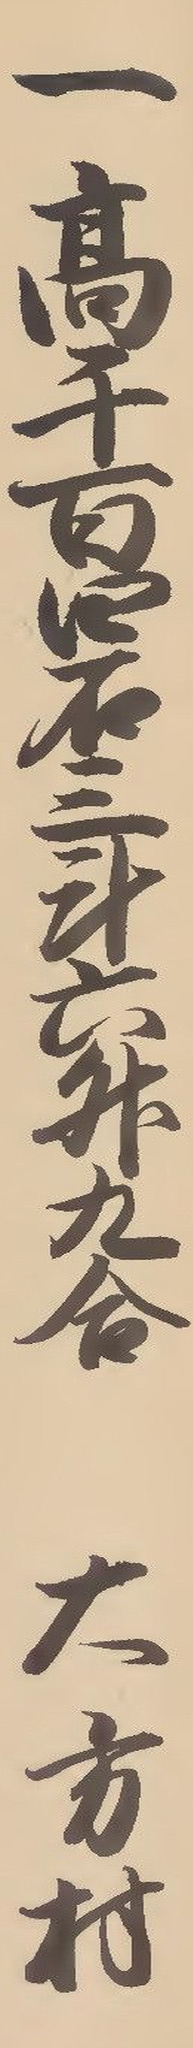一高千百四石三斗六升九合大方村
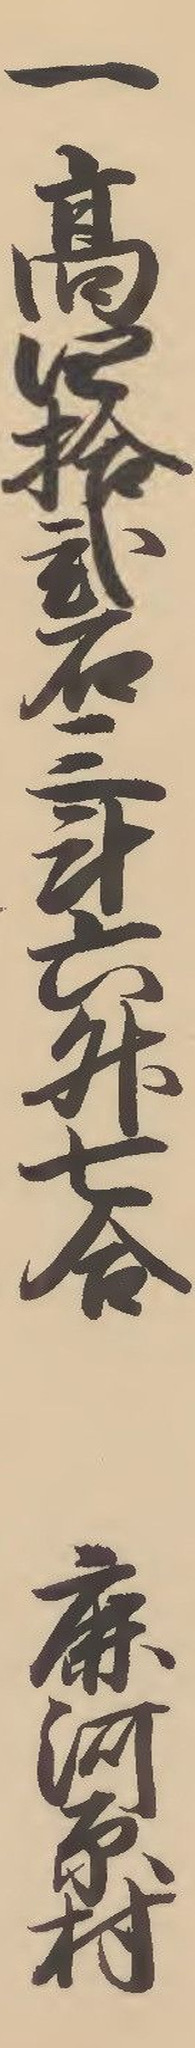一高四拾弐石三斗六升七合鹿河原村
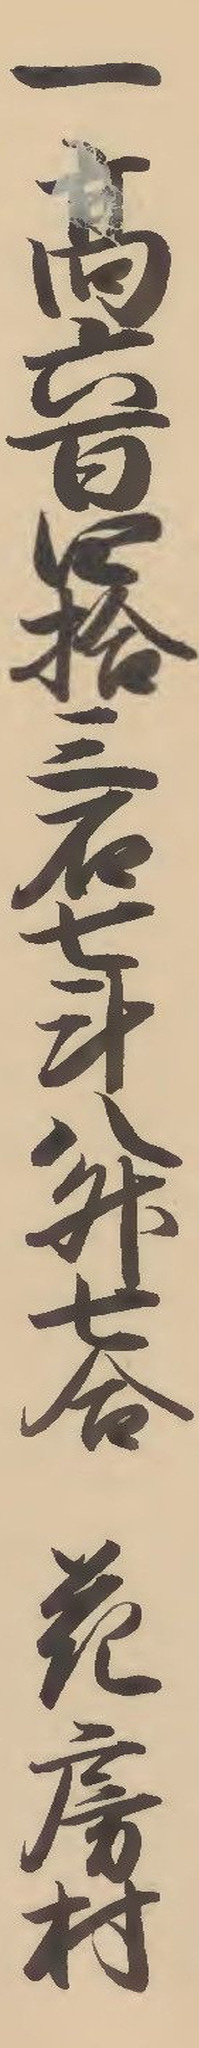一高六百四拾三石七斗八升七合花房村
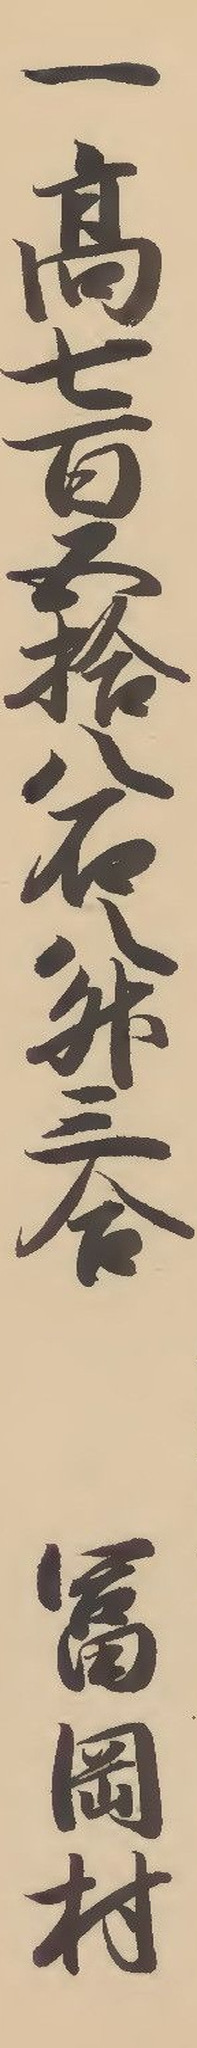一高七百五拾八石八升三合富岡村

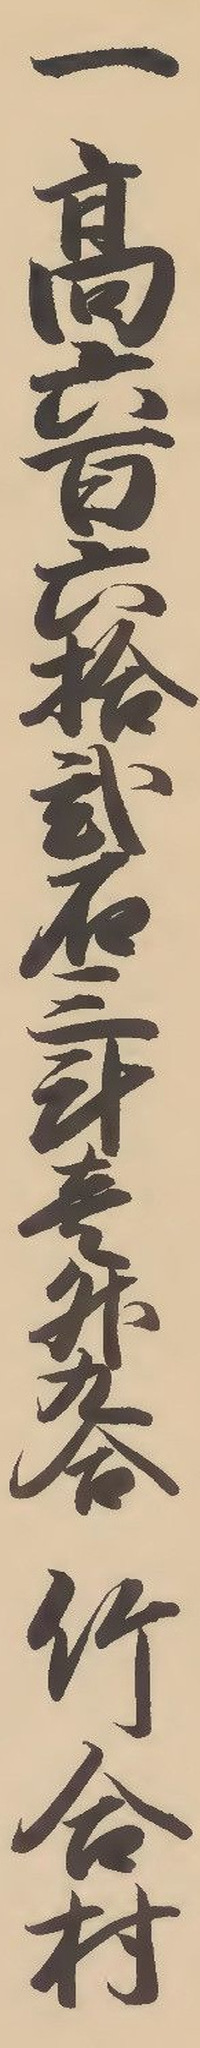一高六百六拾弐石三斗壱升九合竹合村
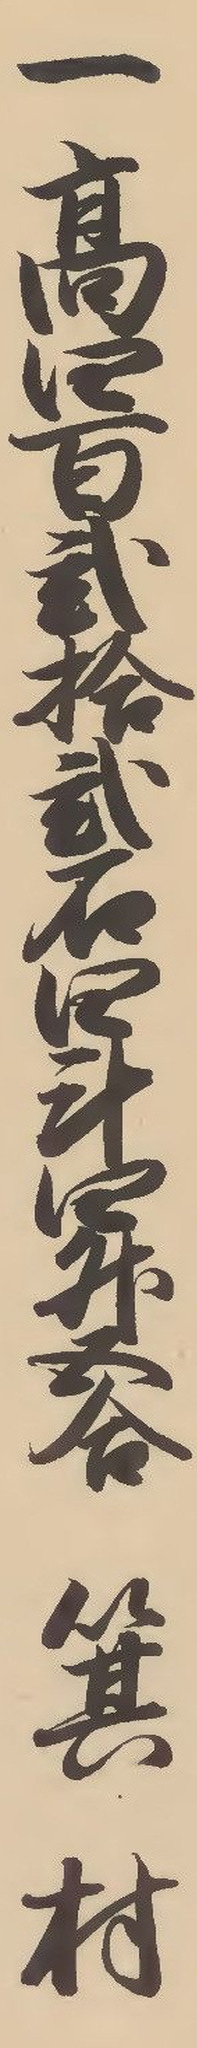一高四百弐拾弐石四斗四升五合箕村
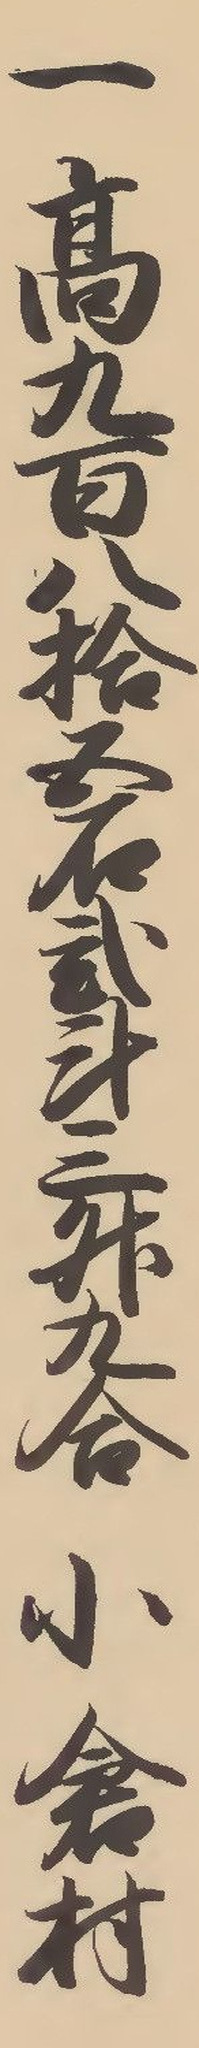一高九百八拾五石弐斗三升九合小倉村
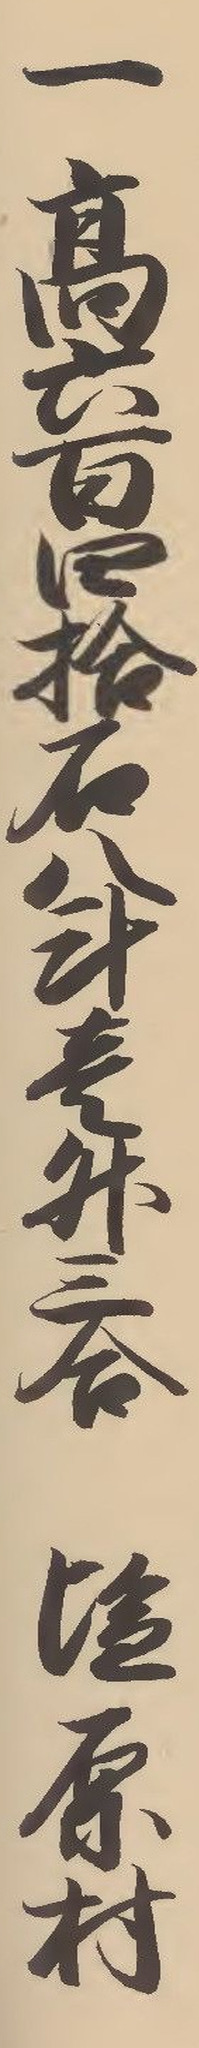一高六百四拾石八斗壱升三合塩原村
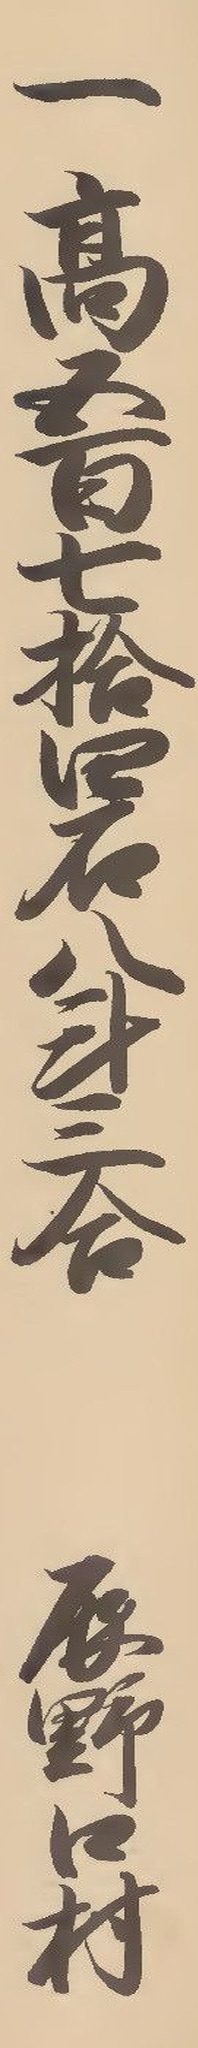一高五百七拾四石八斗三合辰野口村
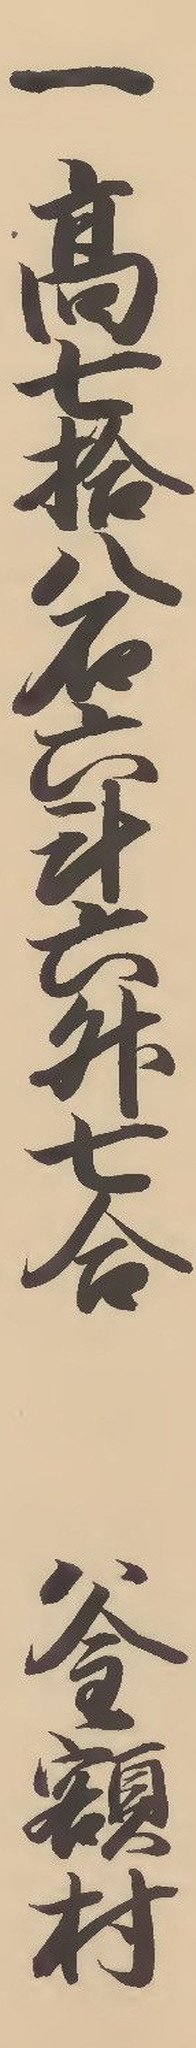一高七拾八石六斗六升七合釜額村
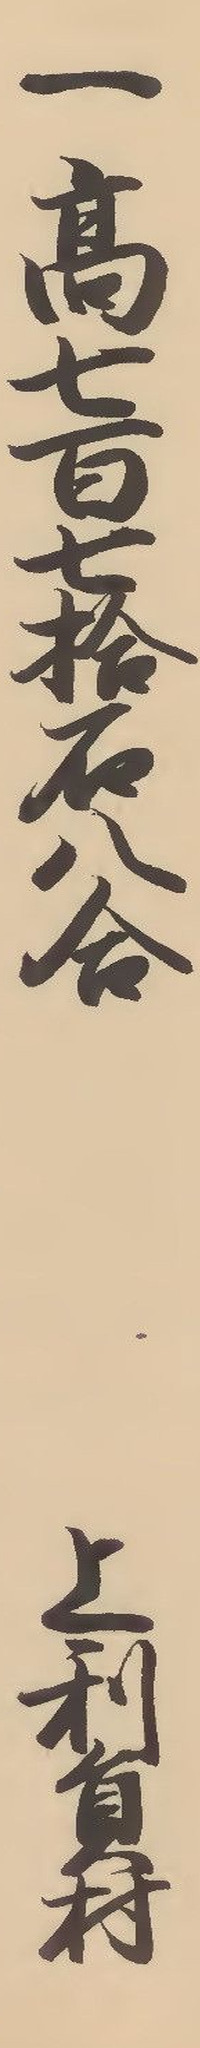一高七百七拾石八合上利員村
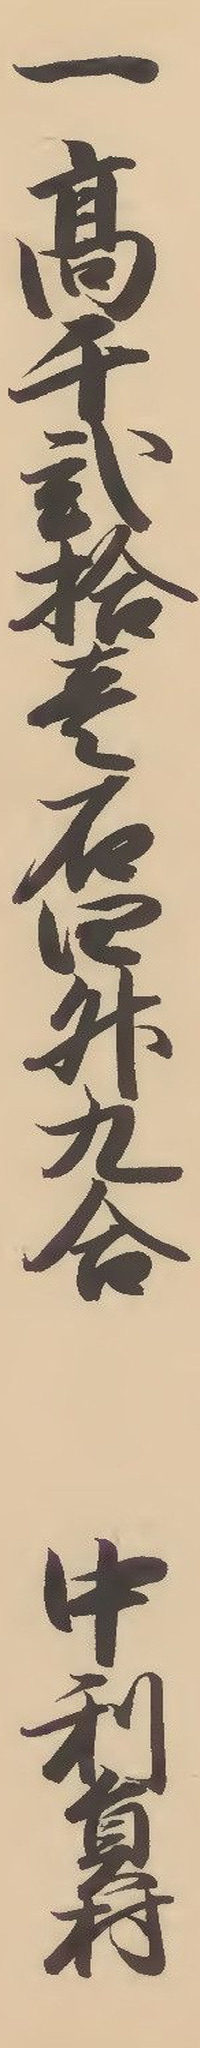一高千弐拾壱石四升九合中利員村

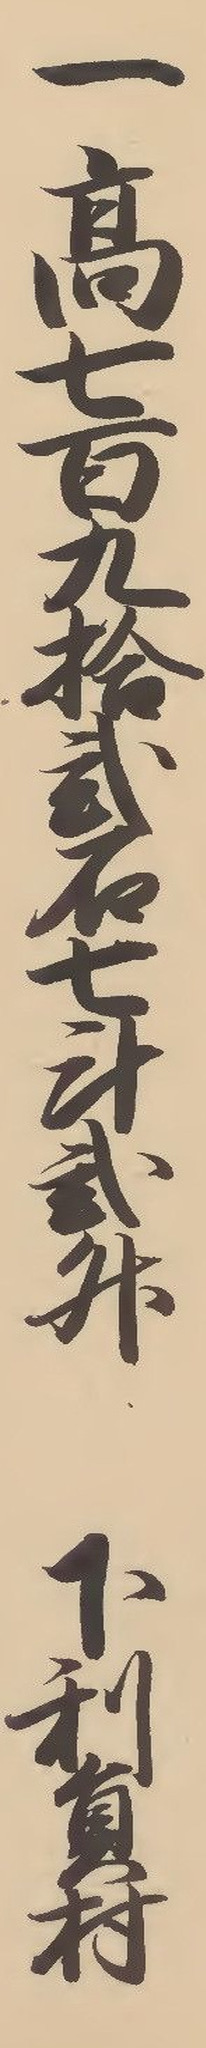一高七百九拾弐石七斗弐升下利員村
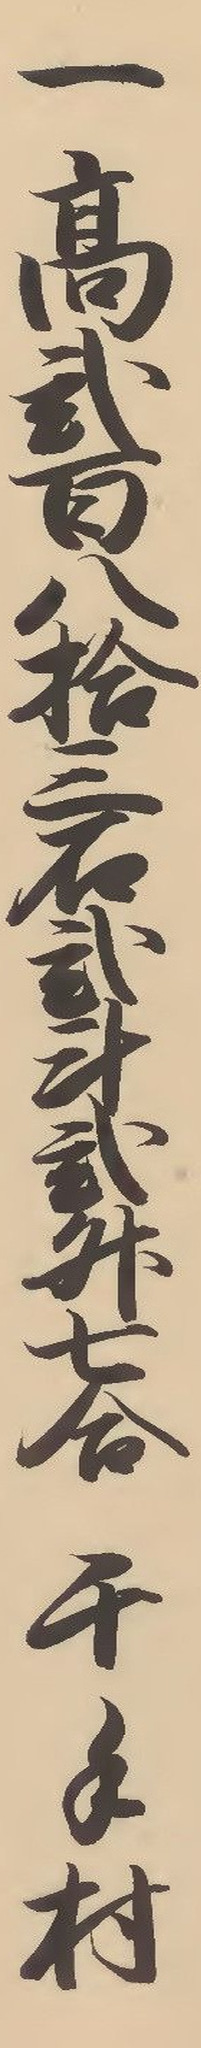一高弐百八拾三石弐斗弐升七合千手村
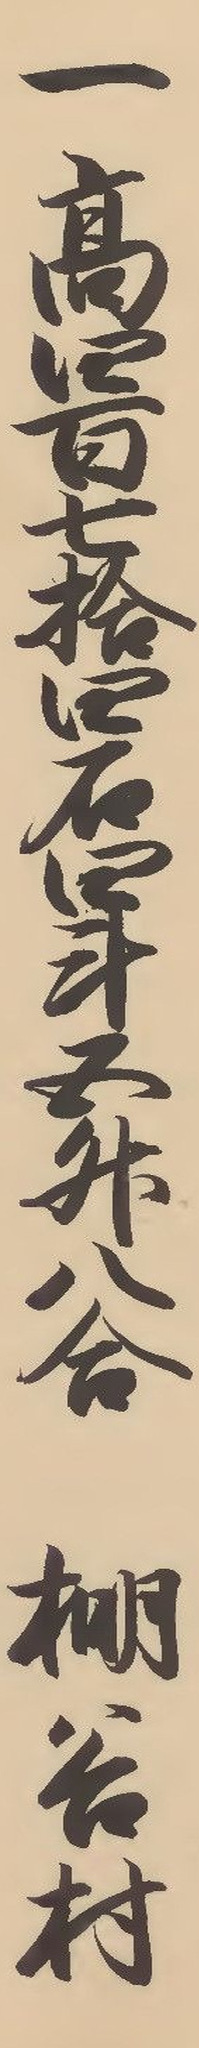一高四百七拾四石四斗五升八合棚谷村
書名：常陸国郷帳
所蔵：国立公文書館 National Archives of Japan
